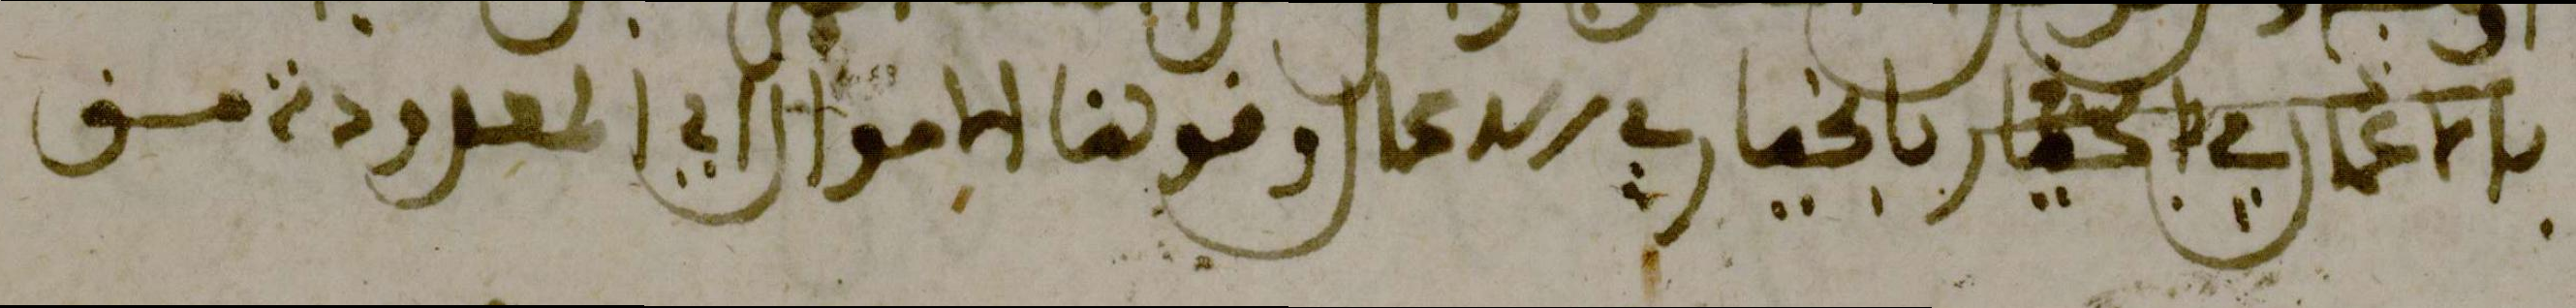بالاعمال في الخيار بالخيار في الاعمال وقولنا الاموال اي المعدودة من
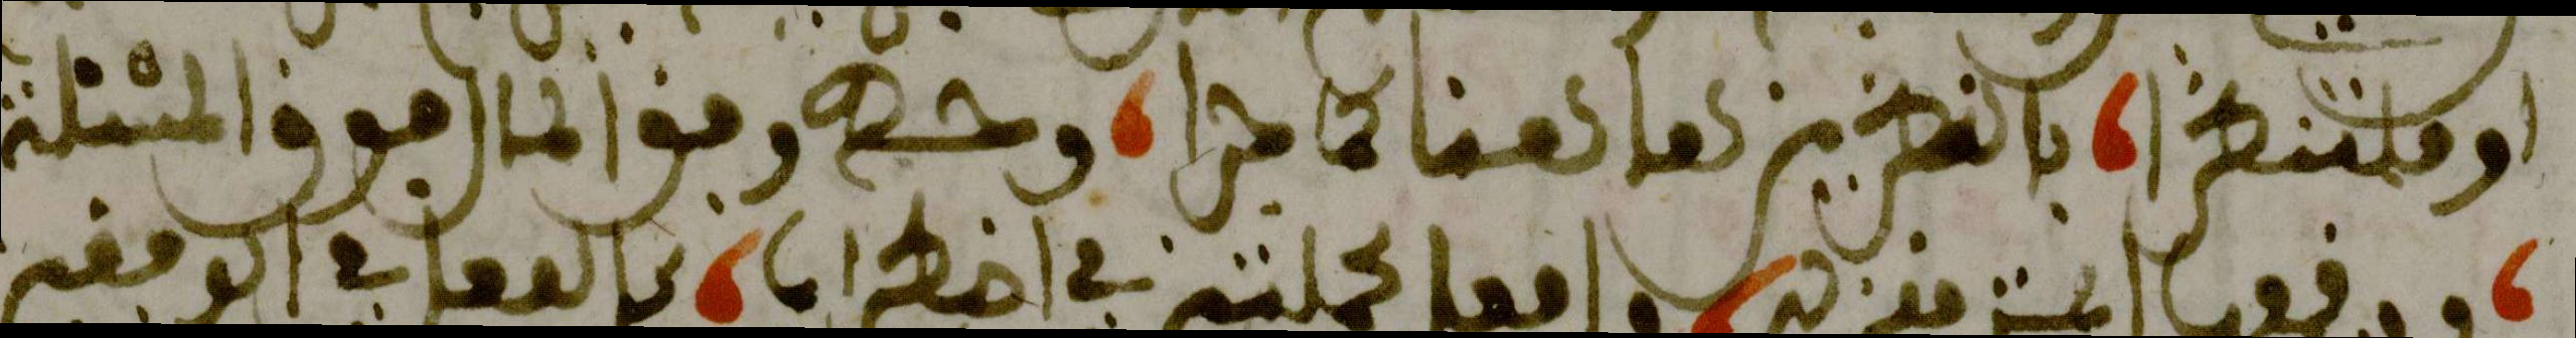او فلتنظرا بالنظرين هاهنا كما جرا وحط وفق المال فوق المسْئلة
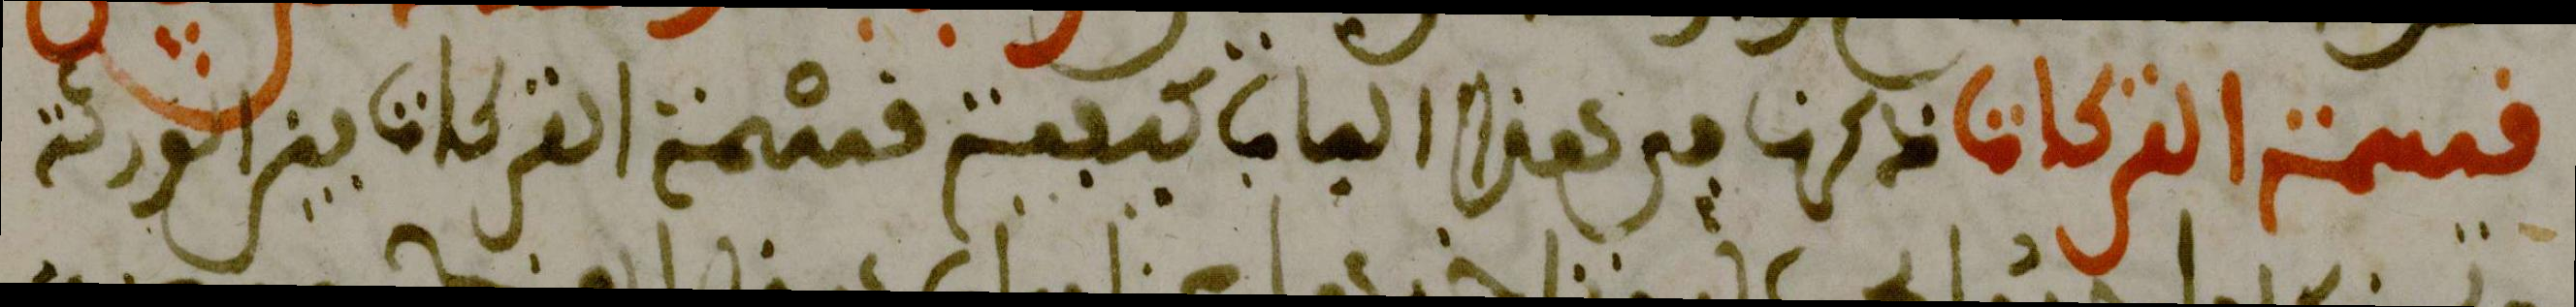قسمة التركات ذكرن في هذا الباب كيفية قسْمة التركات بين الورثة
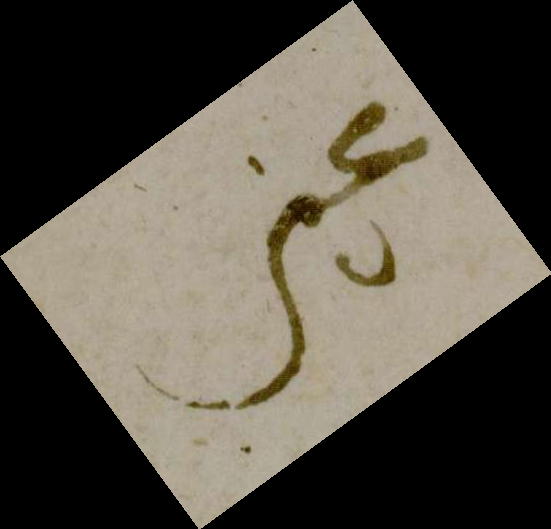عين
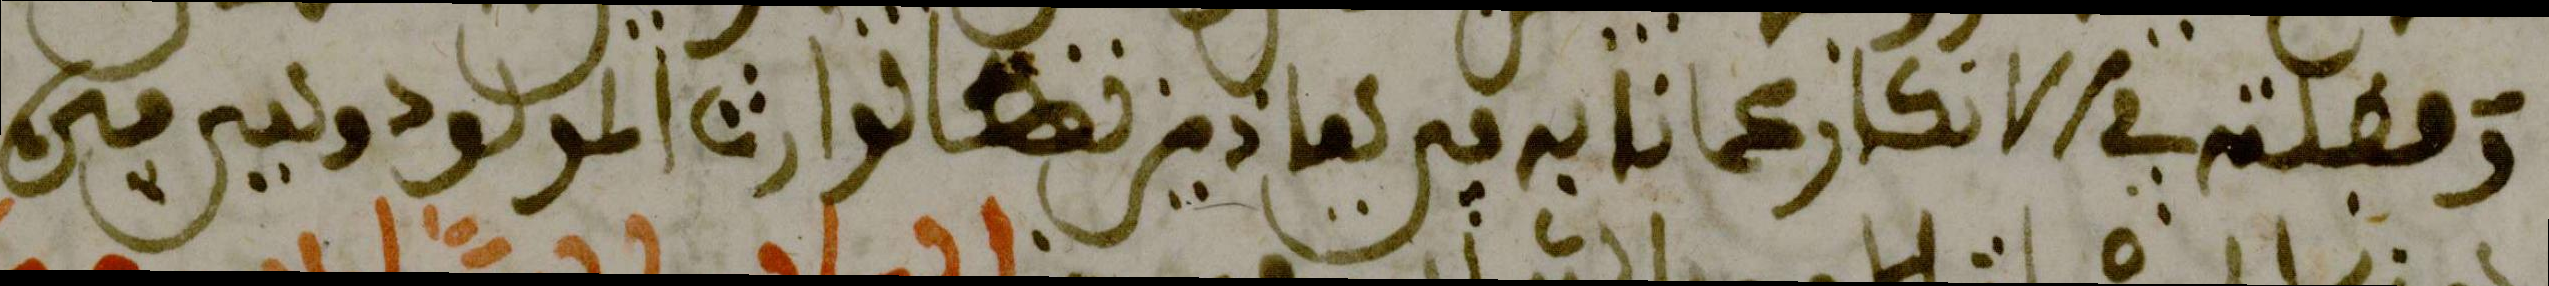وَفضلته في الانكار عمانا به في هاذين تعطا لوارث المولود وهي في
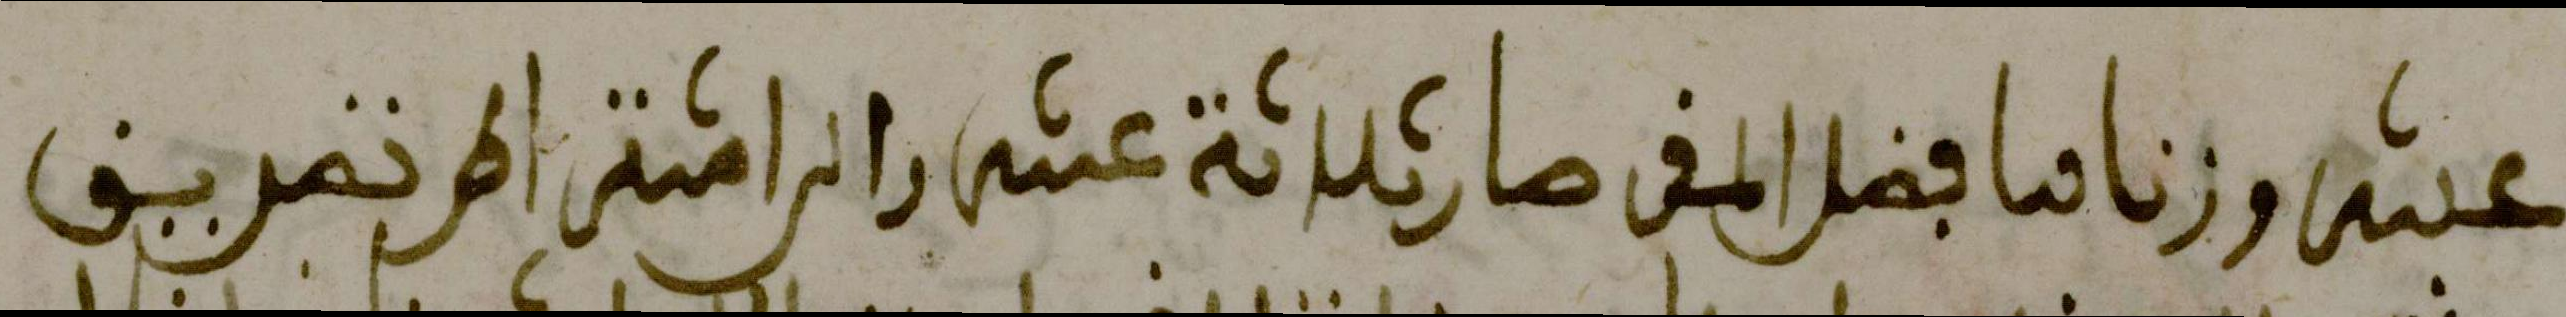عشر وناها فضل المقر صار ثلاثة عشر والى اشتراط تصريق
